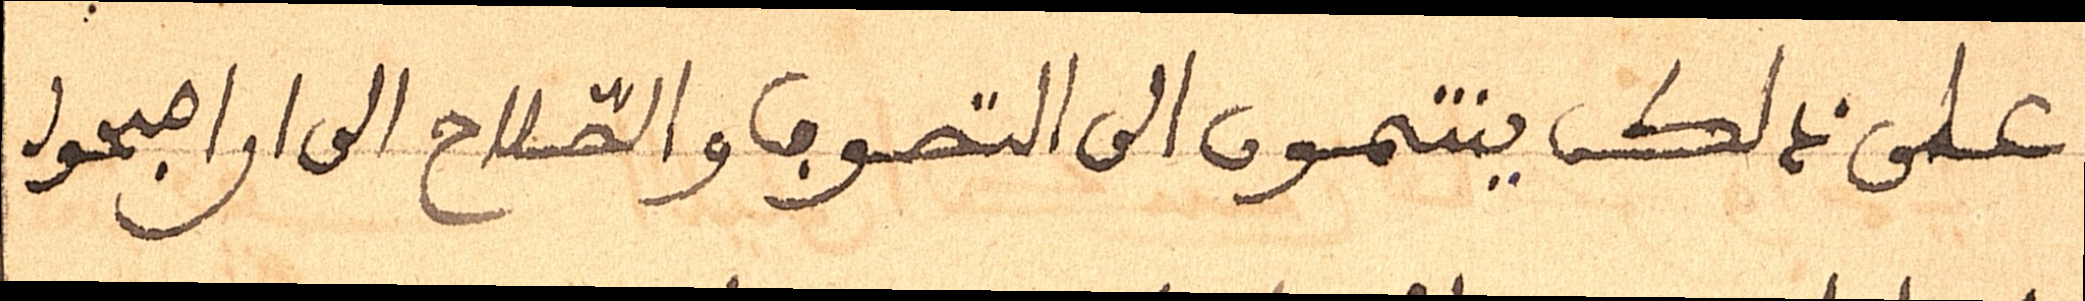على ذلك ينتمون الى التصوف والصلاح الى ان صبحوا
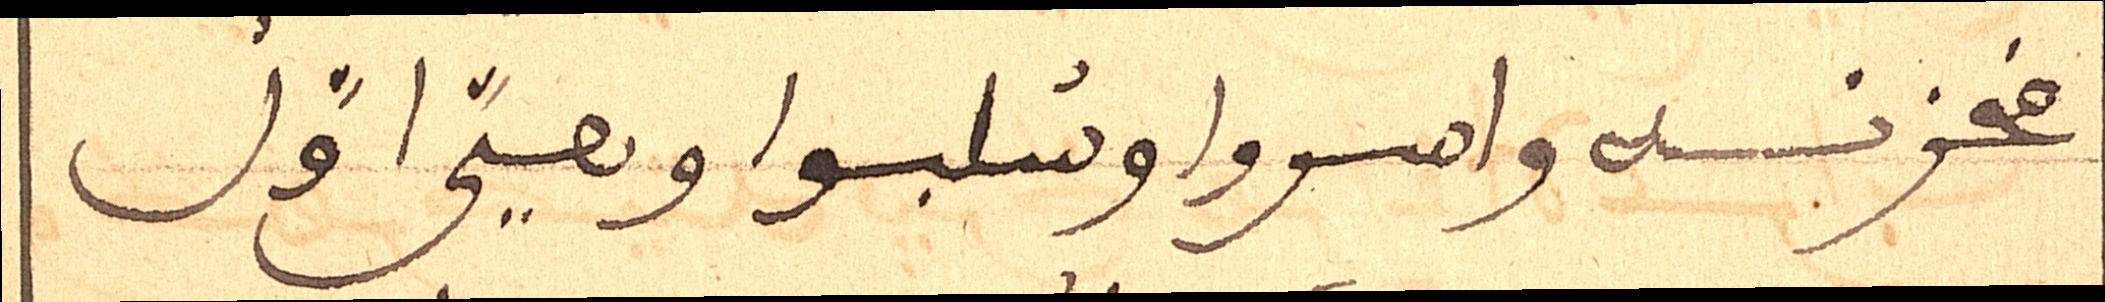مخزنه واسروا وسلبوا وهي اول
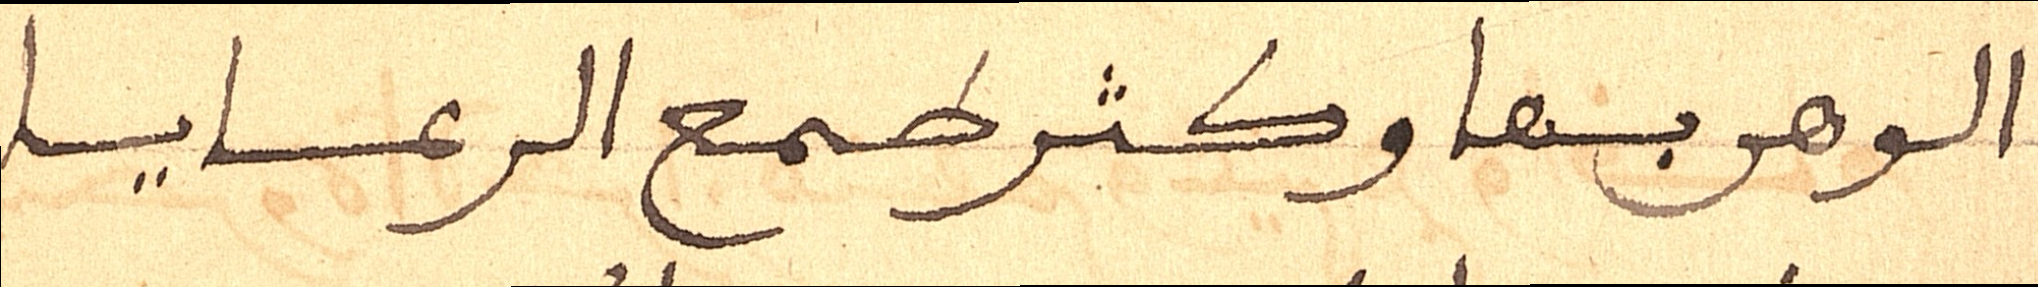الوهن بها وكثر طمع الرعايا
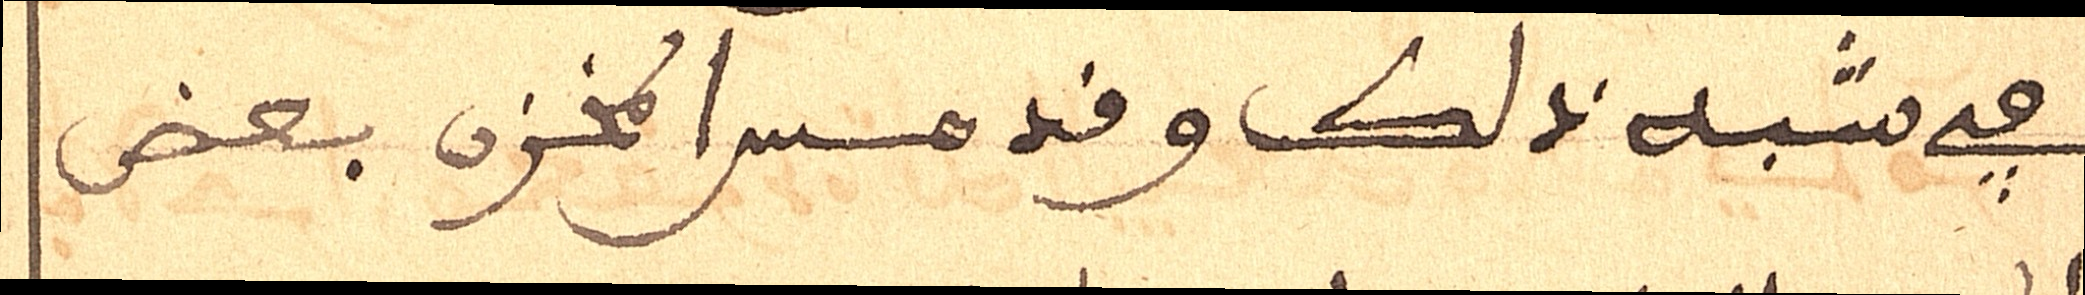في شبه ذلك وقد مس المخزن بعض
